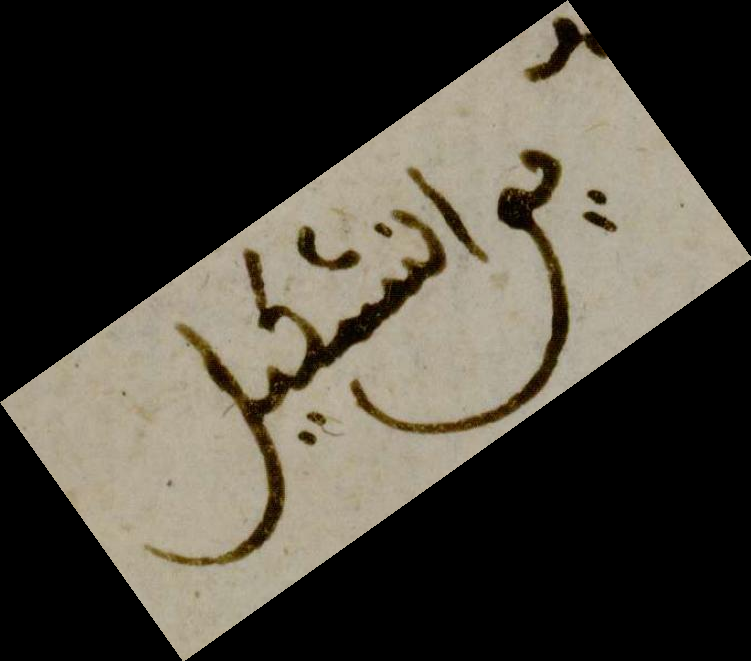في التشكيل
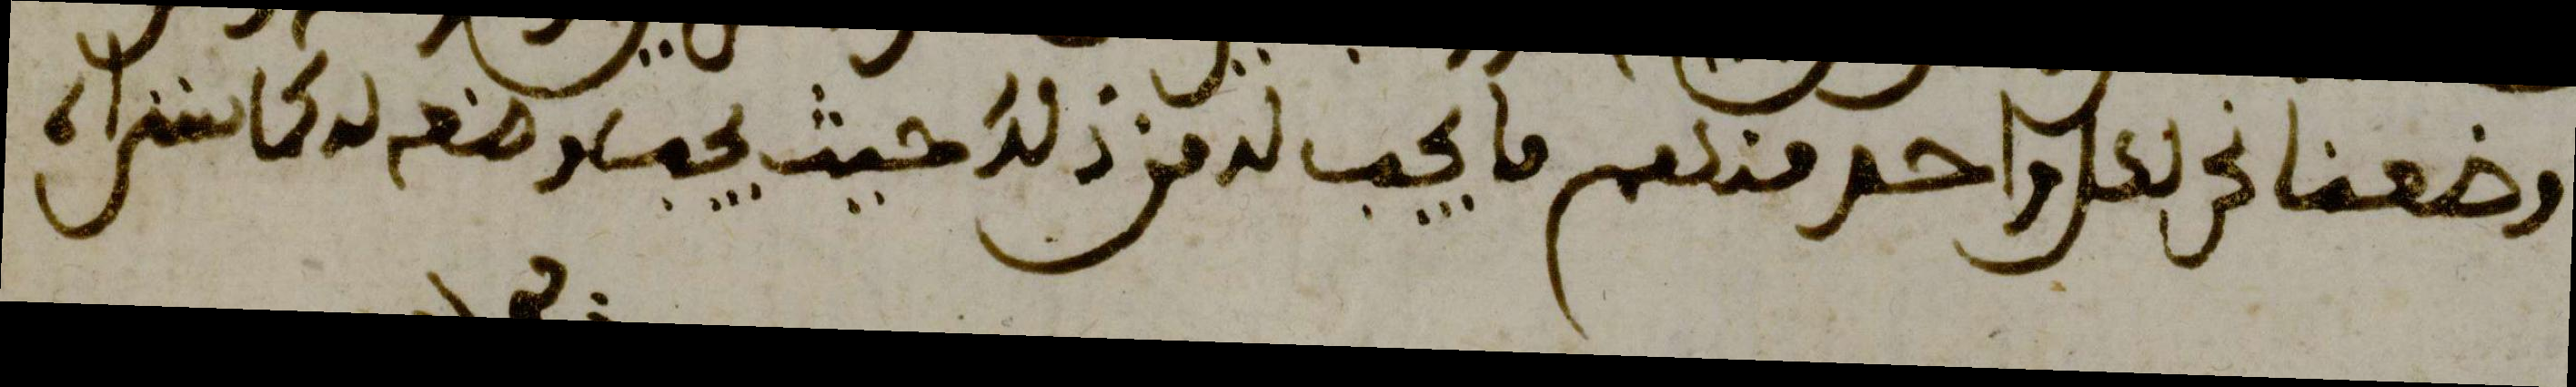وضعنا نحن لكل واحد منهم ما يجب له من ذلك حيث يجب وصفه له كما ستراه
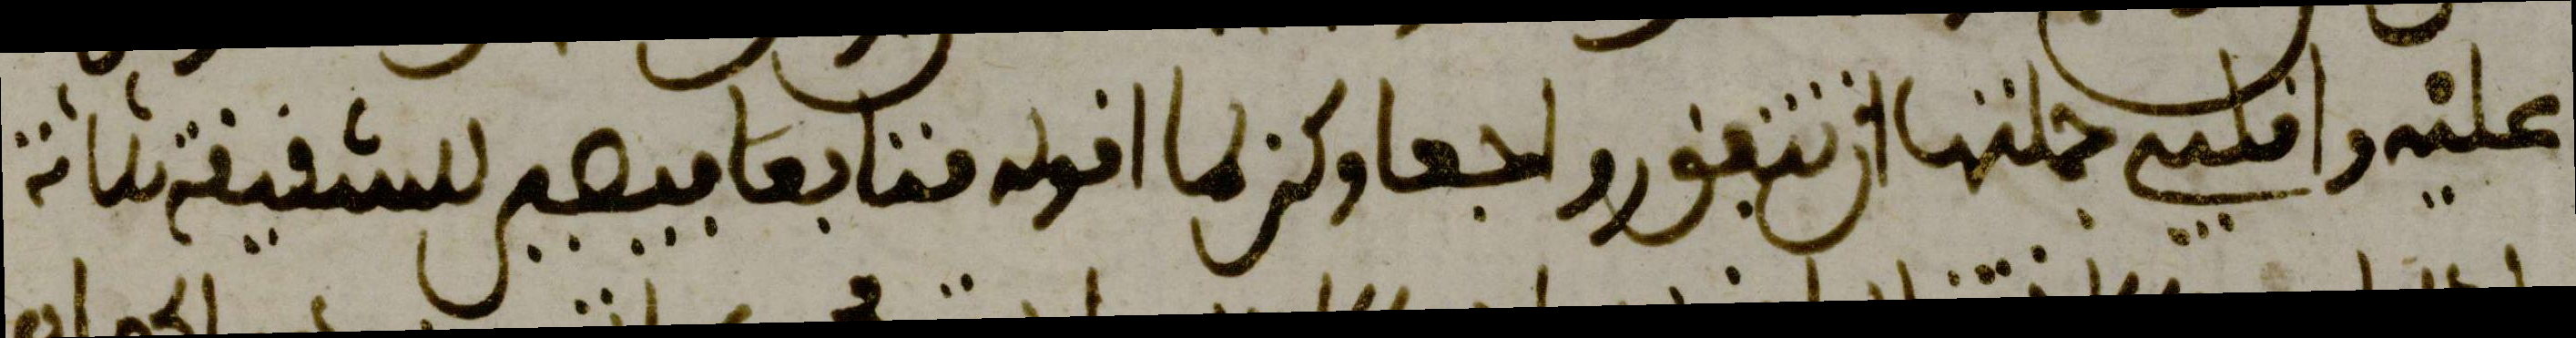عليه واقلبي جملتها ان تتفق رواجعا وكن لما اقوله متابعا فيصير للشقيقة ثلاثة
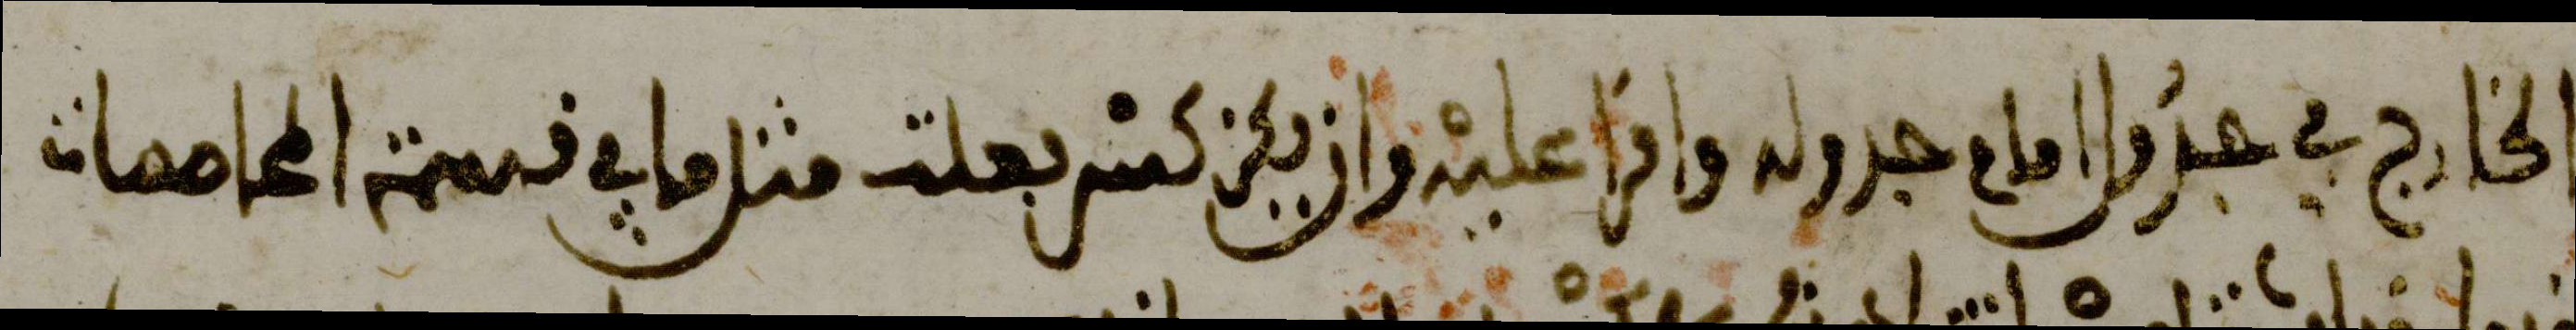الخارج في جدول امام جدوله واقرا عليه وان يكن كسر فعلت مثل ما في قسمة المحاصصات
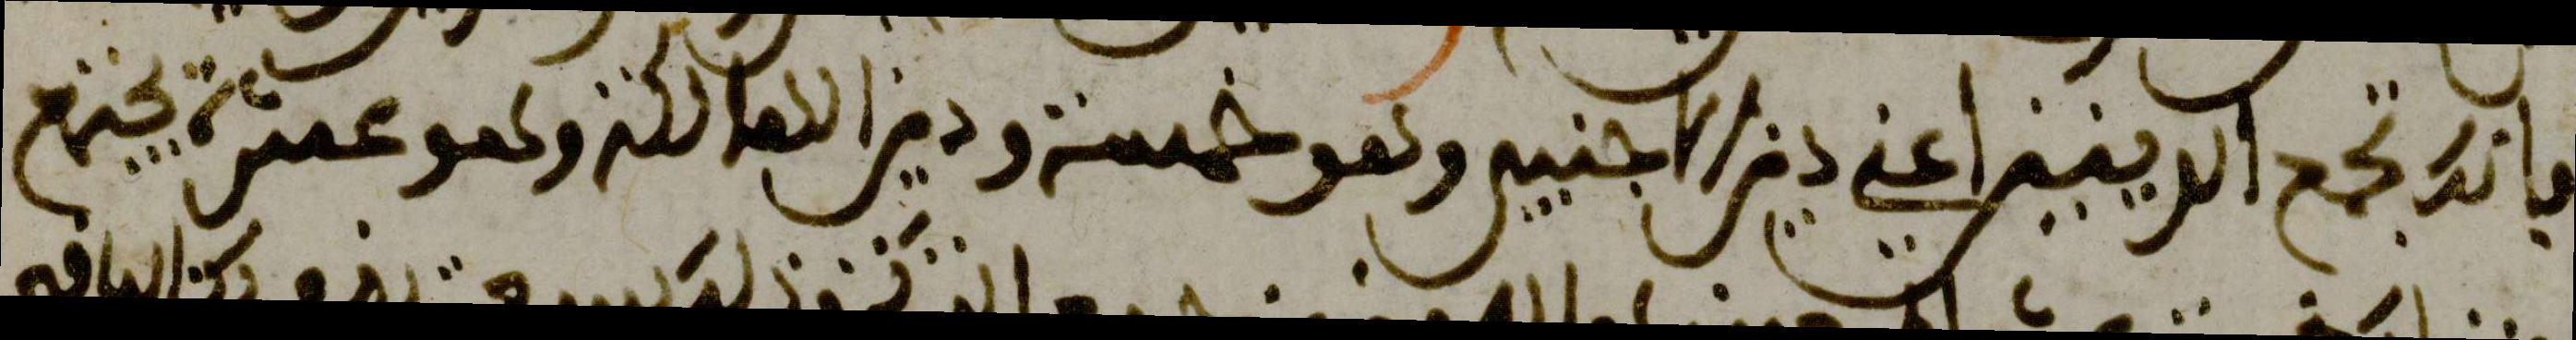فانك تجمع الدينين اعني دين الاجنبي وهو خمسة ودين الهالكة وهوعشرة يجتمع
